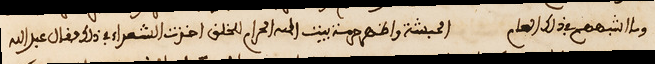وما اشبههم في ذلك العام الحبشة واظهر حرمة بيت الله الحرام للخلق اخذت الشعراء في ذلك فقال عبد الله
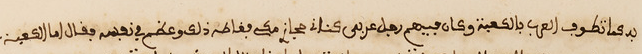به كما تطوف العرب بالكعبة وكان فيهم رجل عربى كنانى حجازى مكى فغاطه ذلك وعظم في نفسه فقال اما الكعبة
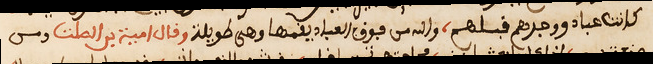كانت عباد ووجدهم قبلهم والله من فوق العباد يقمها وهى طويلة وقال امية بن الصلت ومن
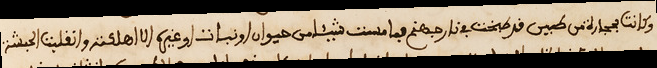وكانت بحجارة من طين قد طبخت في نار جهنم فما مست شيئا من حيوان او نبات او غيره الا اهلكته وانقلبت الحبشة
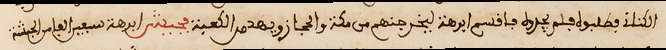الكنانى فطلبوه فلم يجدوه فاقسم ابرهة ليخرجنهم من مكة والحجاز ويهد من الكعبة فجيش ابرهة سبعين الفا من الحبشة
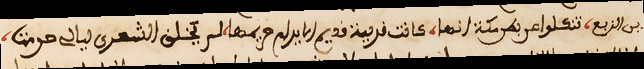بن الذبع تنكلوا عن بطن مكة انها كانت قديمة قديم الا يرام حريمها لم يخلق الشعرى ليالى حرمت
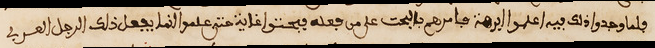فلما وجدوا ذلك فيه اعلموا ابرهة فامرهم بالبحت على من فعله فبحتوا غاية حتى علموا انما يفعل ذلك الرجل العربى
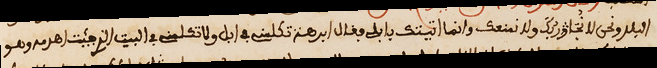البلد ونحن لا نجاوربك ولا نمنعك وانما اتيتك بابلى فقال ابرهة تكلمنى في ابل ولا تكلمنى في البيت الذي جئت اهدمه وهو
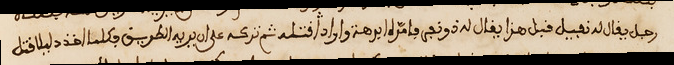رجل يقال له نفيل قبل هذا يقال له ذو نفر فامّره ابرهة وارادا قتله ثم تركه على ان يريه الطريق فكلما اخذ دليلا قتل
